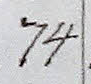74
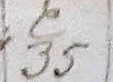35
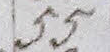55
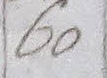60
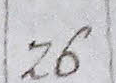26
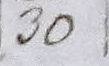30
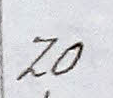20
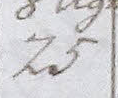25
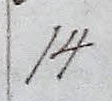14
